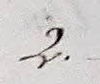2.
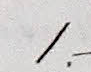1
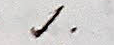1.
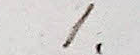1.
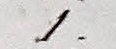1.
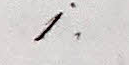1.
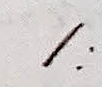1
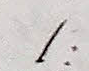1
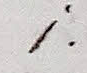1
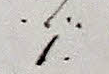1.
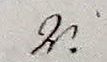2.
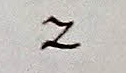2
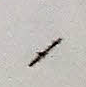1
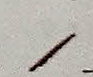1
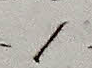1
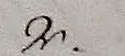2.
